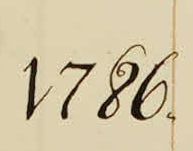1786
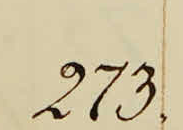273
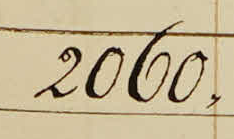2060
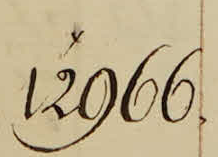12966
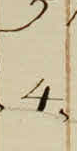4
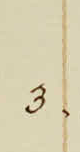3
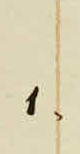1
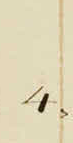4
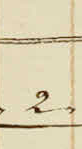2
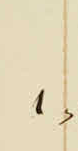1
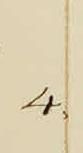4
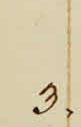3
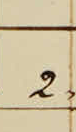2
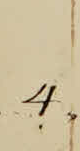4
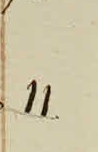11.
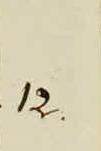12.
